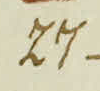27
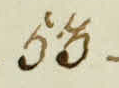53
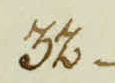32
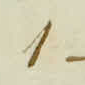1
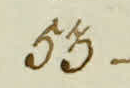53
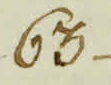63
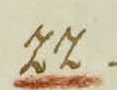22
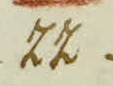22
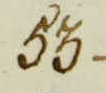53
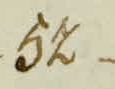52
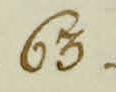63
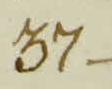37
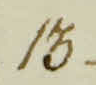13
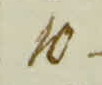10
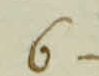6
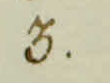3.
